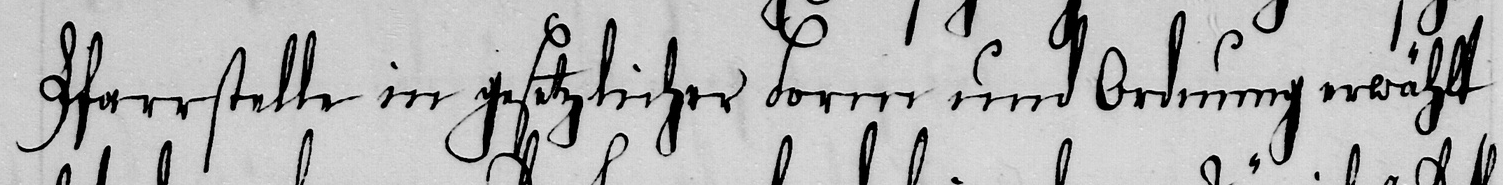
Pfarrstelle in gesetzlicher Form und Ordnung erwählt
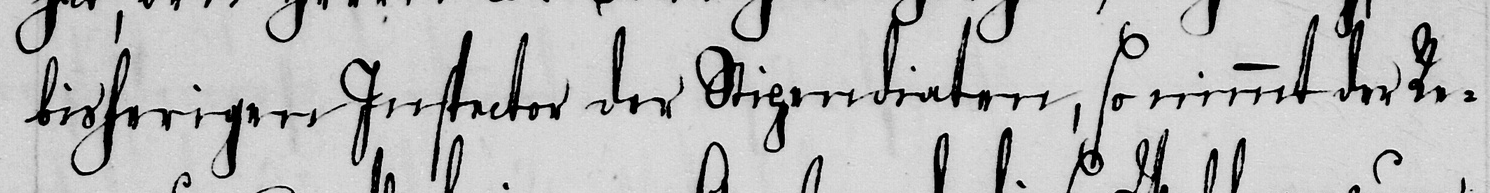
bisherigen Inspector der Stipendiaten, so nimmt der Re¬
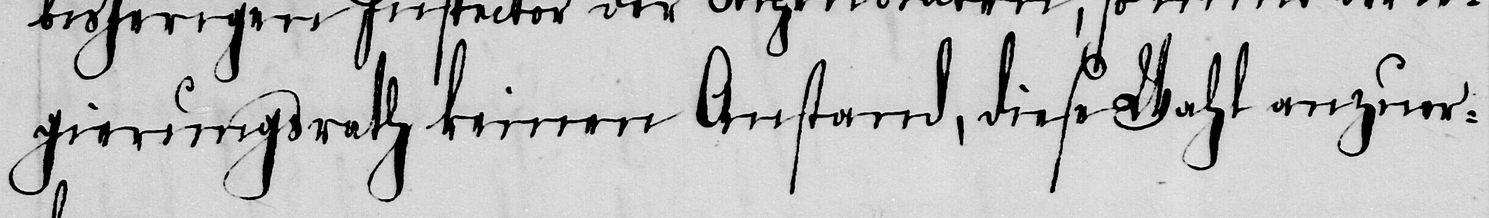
gierungsrath keinen Anstand, diese Wahl anzuer¬
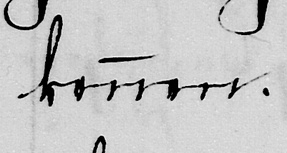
kennen.
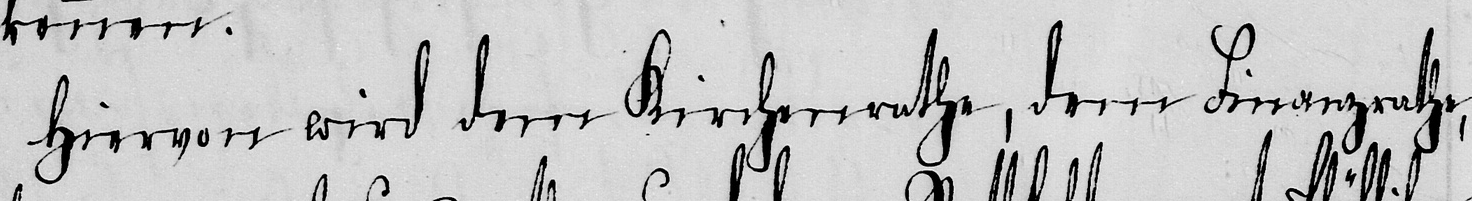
Hiervon wird dem Kirchenrathe, dem Finanzrathe,
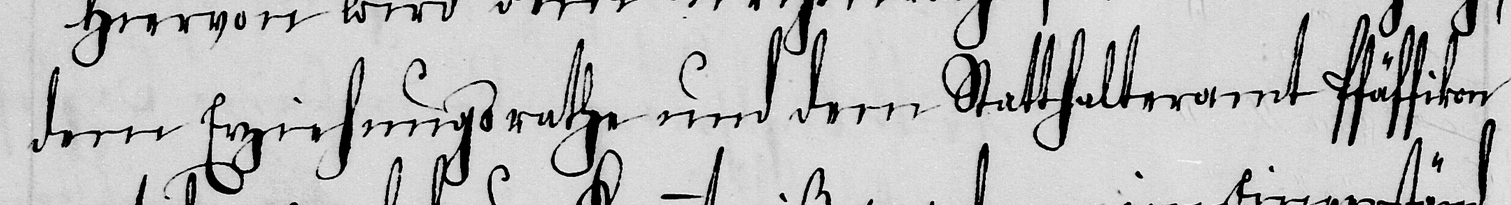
dem Erziehungsrathe und dem Statthalteramt Pfäffi¬
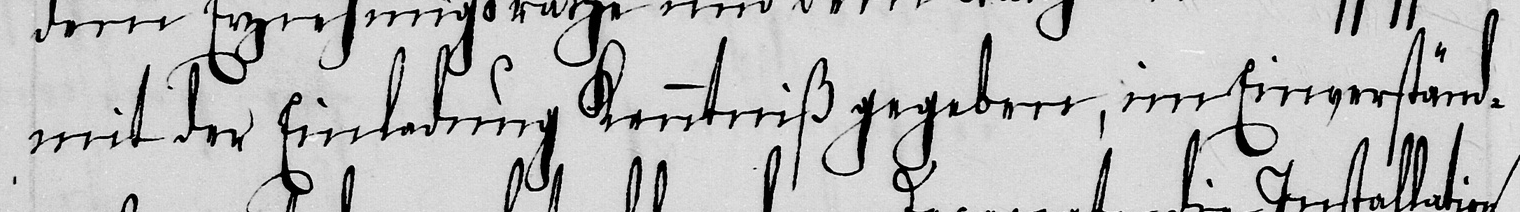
mit der Einladung Kenntniß gegeben, im Einverständ¬
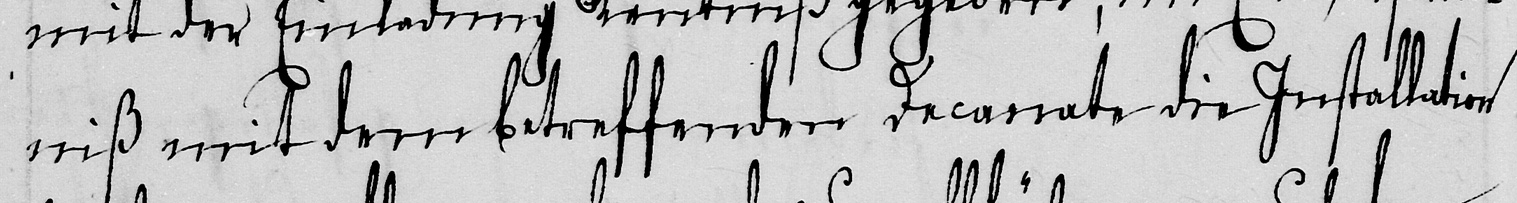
niß mit dem betreffenden Decanate die Installat¬
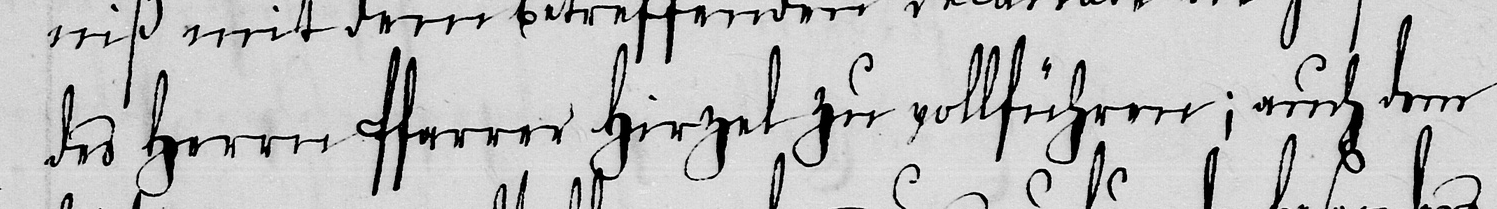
des Herrn Pfarrer Hirzel zu vollführen; auch dem
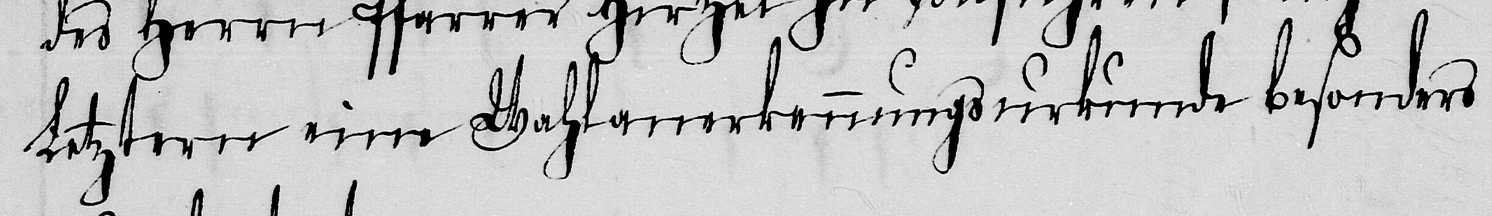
Letztern eine Wahlanerkennungsurkunde besonders
